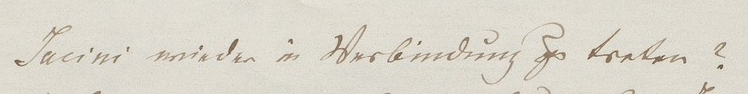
Jacini wieder in Verbindung zu treten?
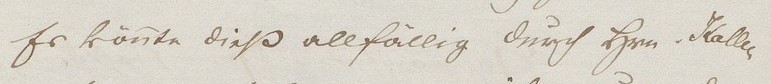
Es könnte dieß allfällig durch Hrn. Koller
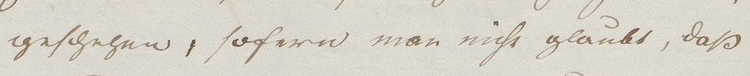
geschehen, sofern man nicht glaubt, daß
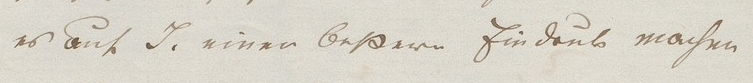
es auf J. einen beßern Eindruk machen
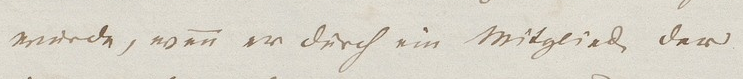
würde, wenn er durch ein Mitglied der
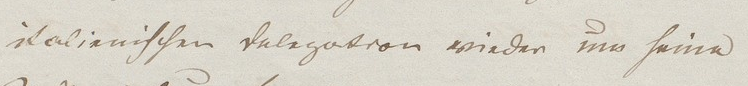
italienischen Delegation wieder um seine
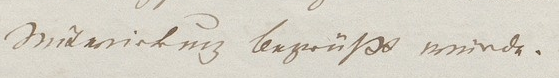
Mitwirkung begrüßt würde. –
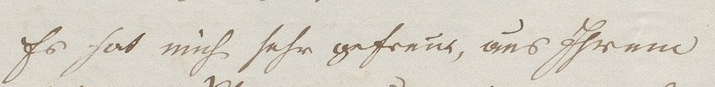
Es hat mich sehr gefreut, aus Ihrem
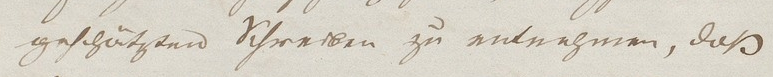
geschätzten Schreiben zu entnehmen, daß
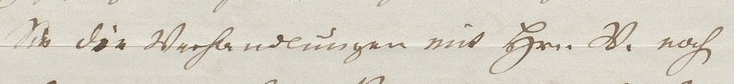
Sie die Verhandlungen mit Hrn. W. noch
